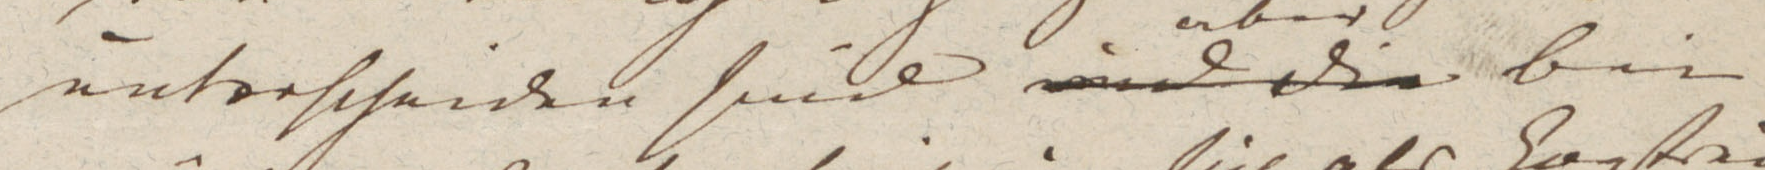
unterscheiden sind die aber bei
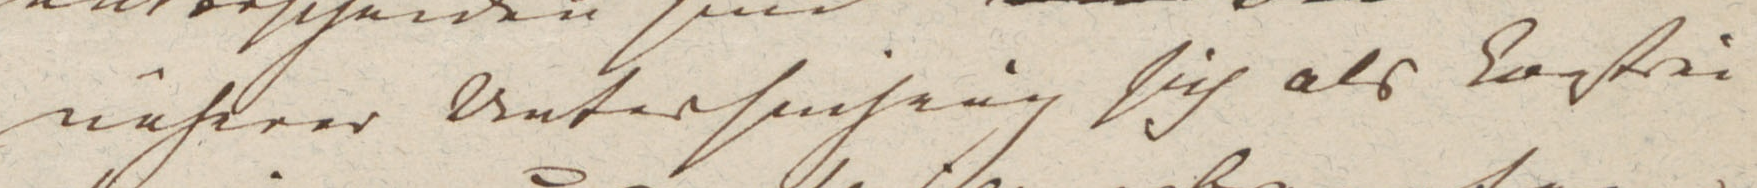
näherer Untersuchung sich als Construc-
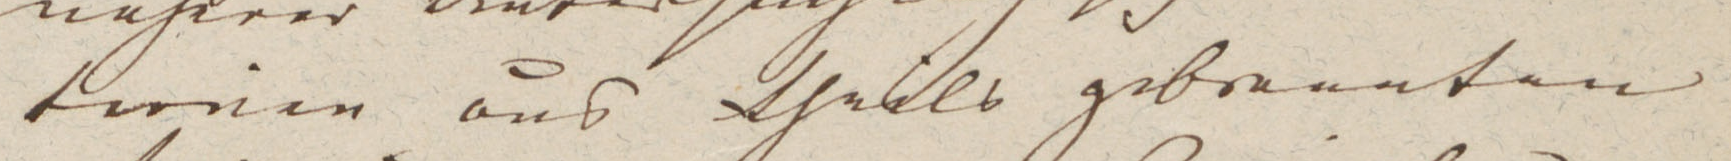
tionen aus theils gebrannten
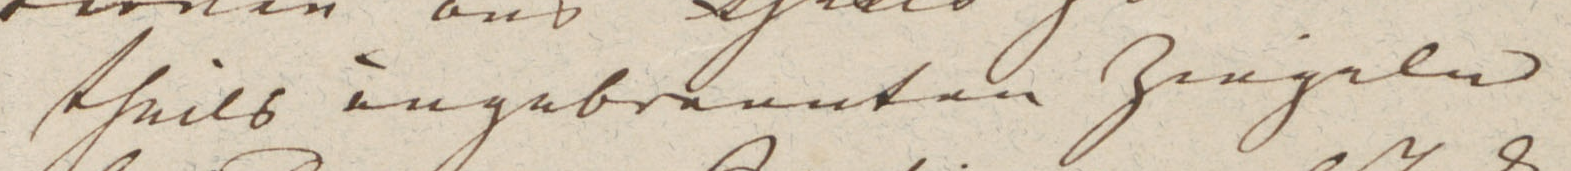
theils ungebrannten Ziegeln
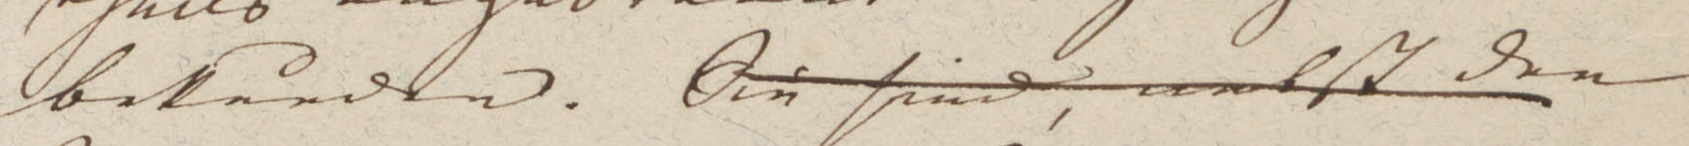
bekunden. Sie sind, nebst den
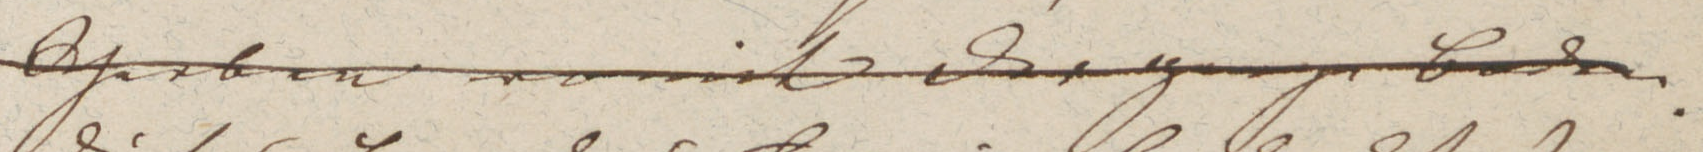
Scherben womit der ganze Boden
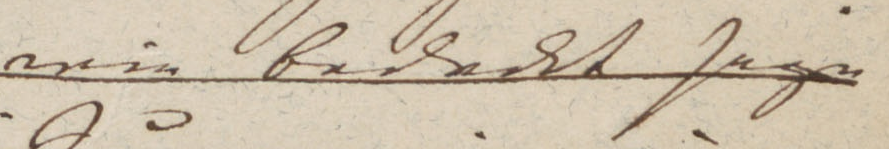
wie bedeckt seyn
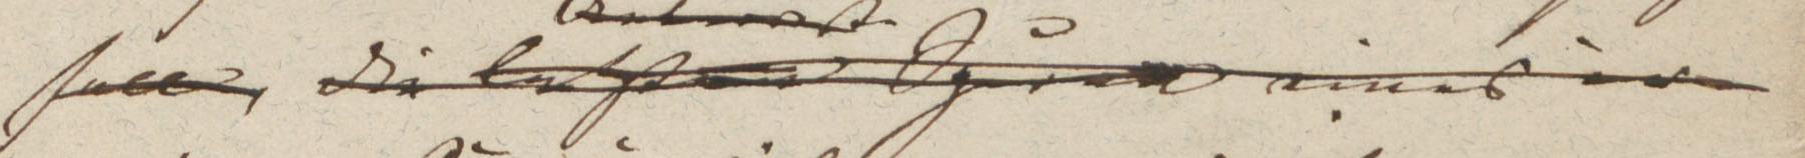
soll, die letzten Spuren eines ur-
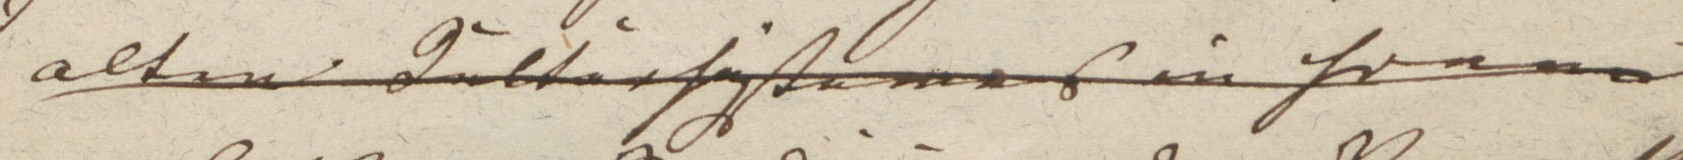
alten Kultursystemes in ihrem
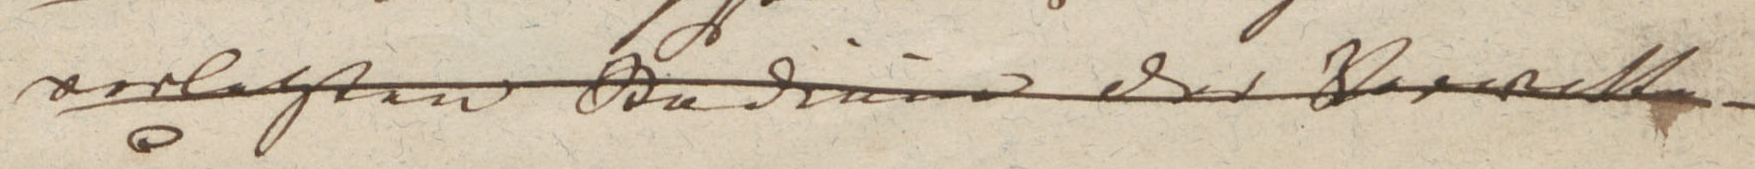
vorletzten Stadium der Verwitte-
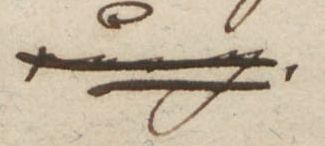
und feindseligen
